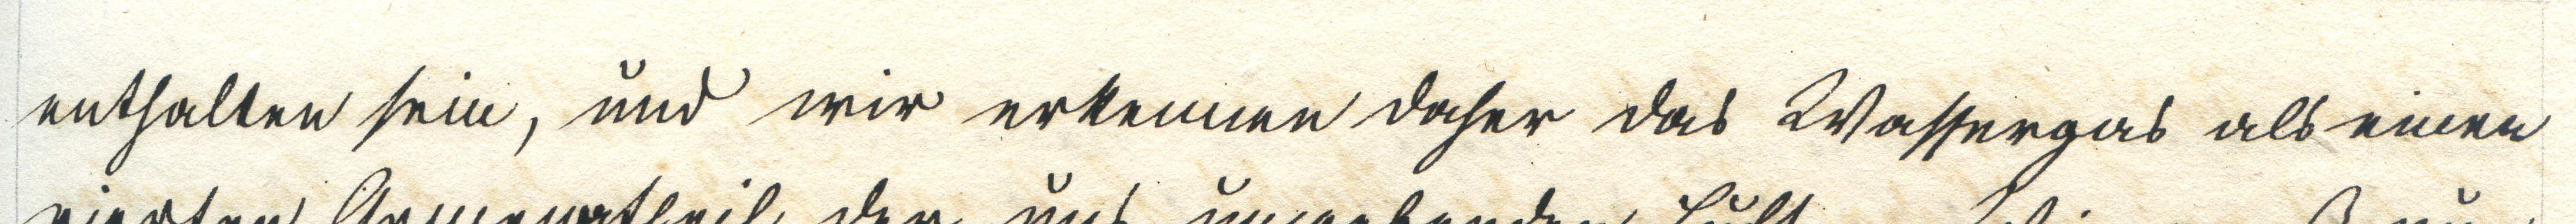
enthalten sein, und wir erkennen daher das Wassergas als einen
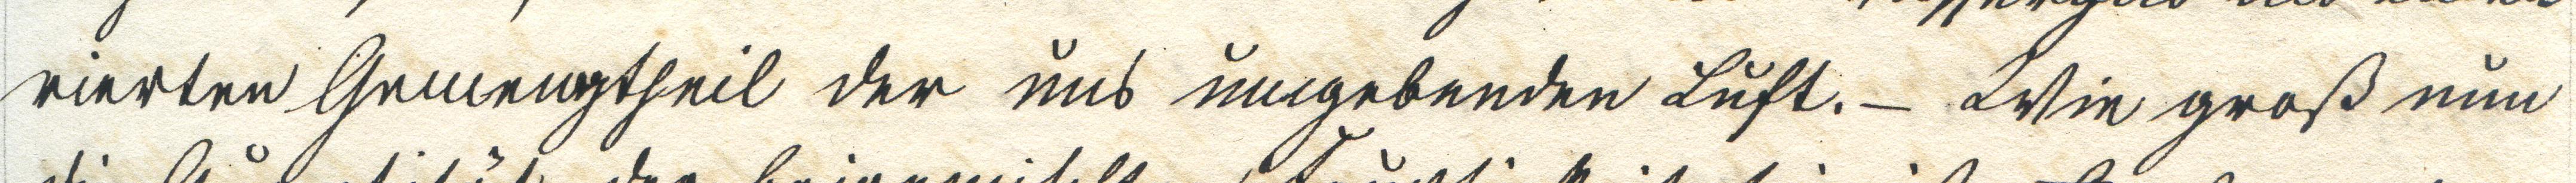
vierten Gemengtheil der uns umgebenden Luft. – Wie groß nun
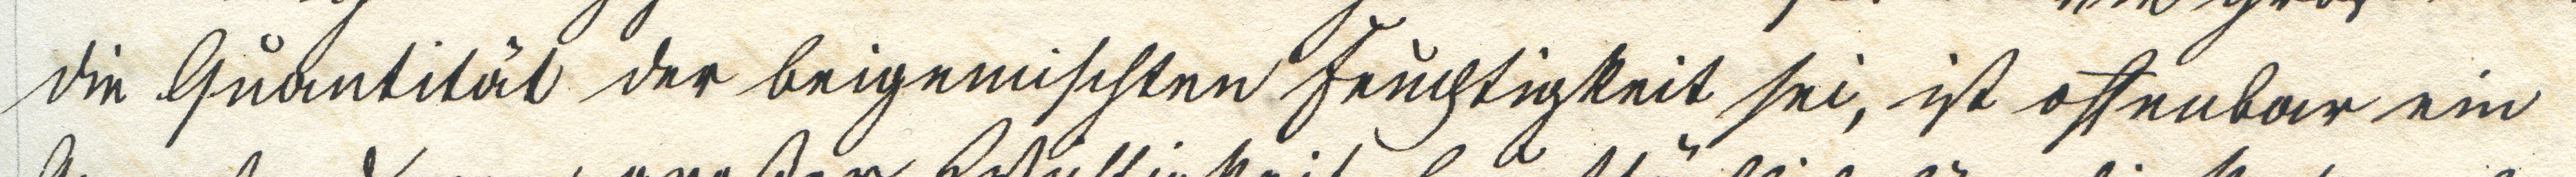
die Quantität der beigemischten Feuchtigkeit sei, ist offenbar ein
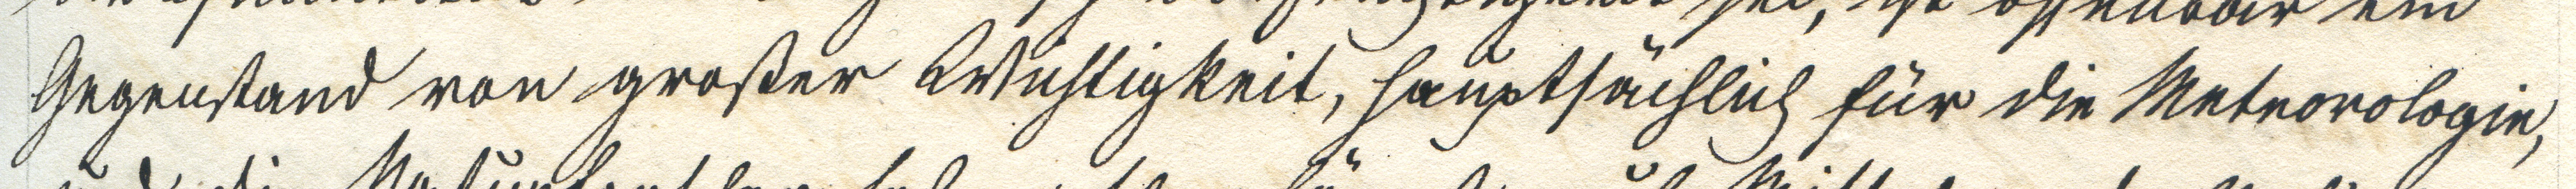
Gegenstand von großer Wichtigkeit, hauptsächlich für die Meteorologie,
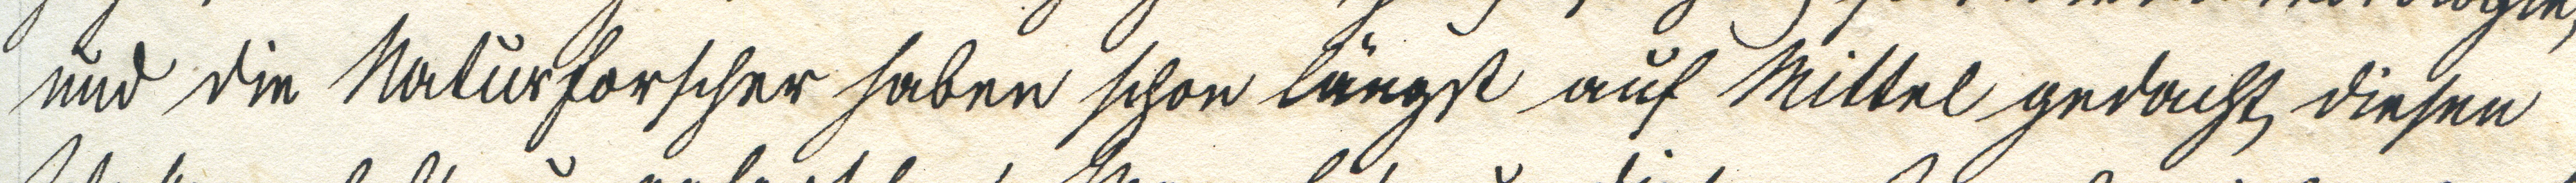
und die Naturforscher haben schon längst auf Mittel gedacht, diesen
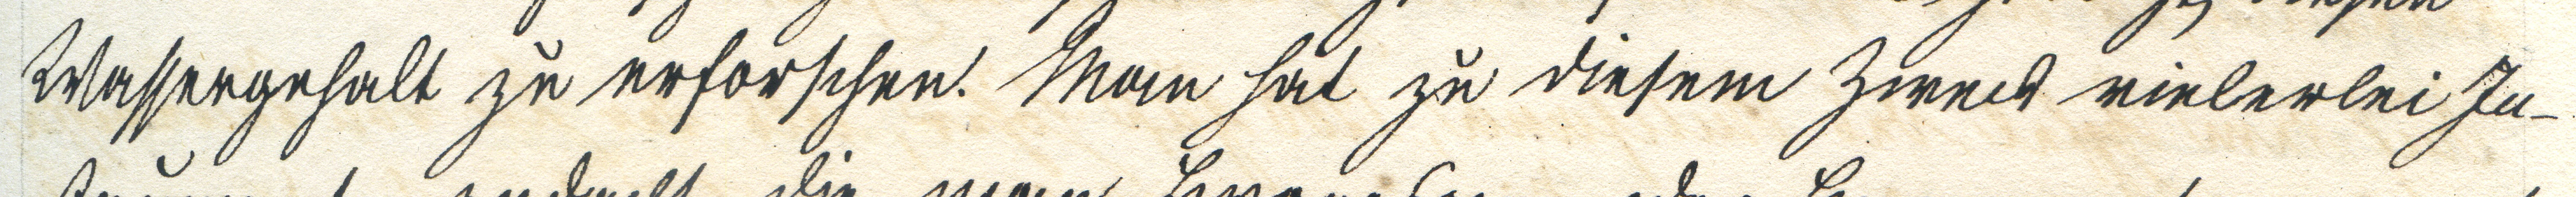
Wassergehalt zu erforschen. Man hat zu diesem Zwecke vielerlei In-
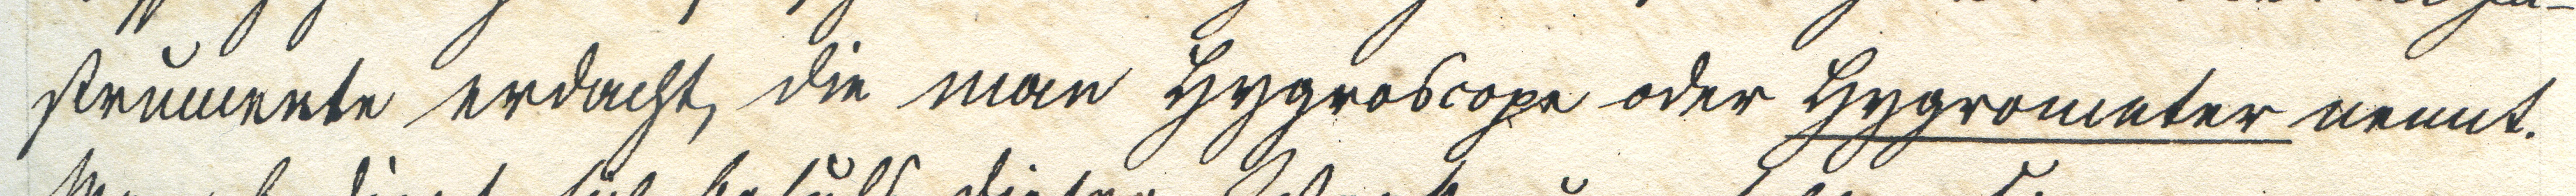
strumente erdacht, die man Hygroscope oder Hygrometer nennt.
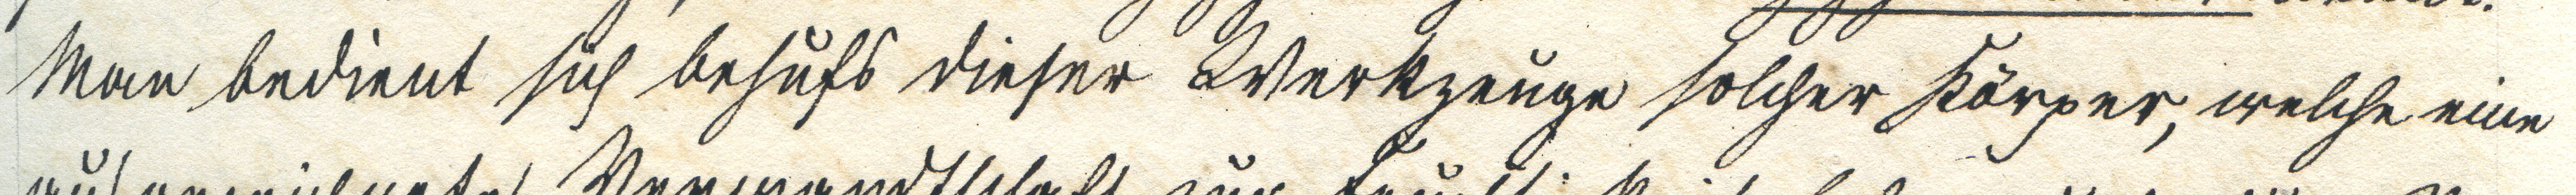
Man bedient sich Behufs dieser Werkzeuge solcher Körper, welche eine
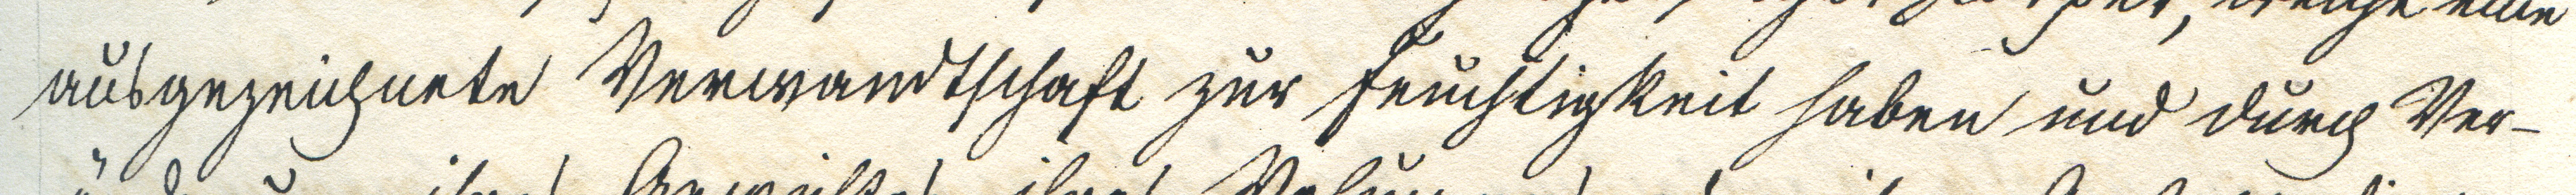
ausgezeichnete Verwandschaft zur Feuchtigkeit haben und durch Ver-
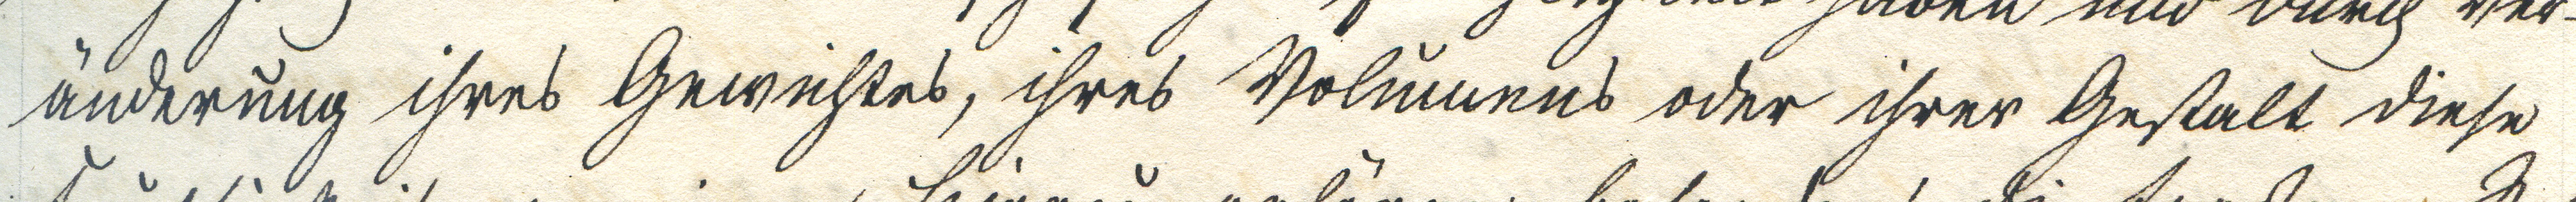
änderung ihres Gewichtes, ihres Volumens, oder ihrer Gestalt diese
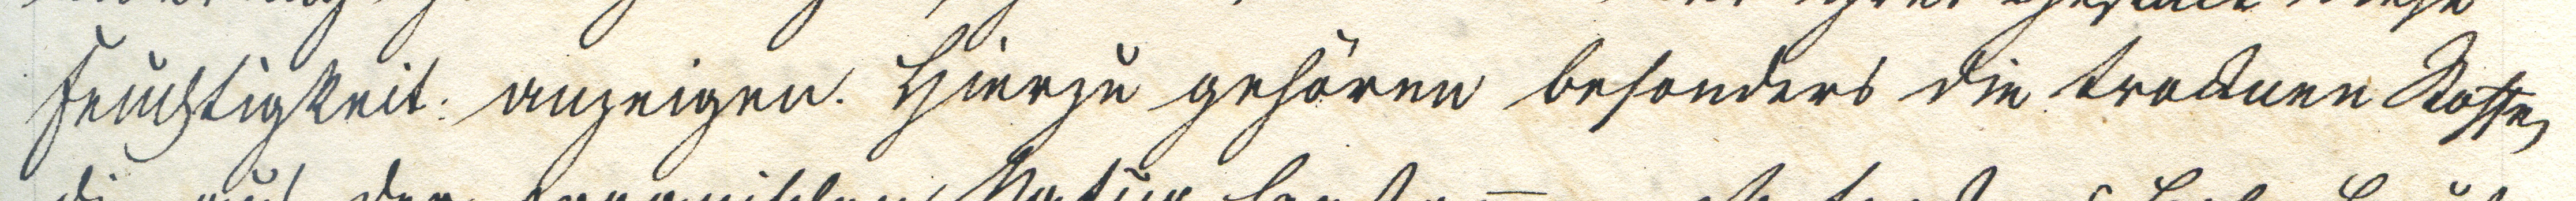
Feuchtigkeit anzeigen. Hierzu gehören besonders die trocknen Stoffe,
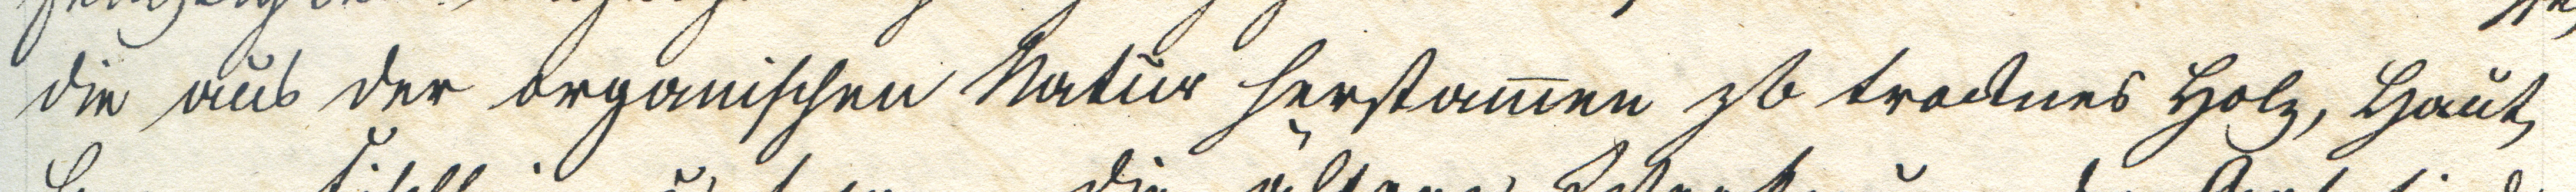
die aus der organischen Natur herstam̃en, zb trocknes Holz, Haut,
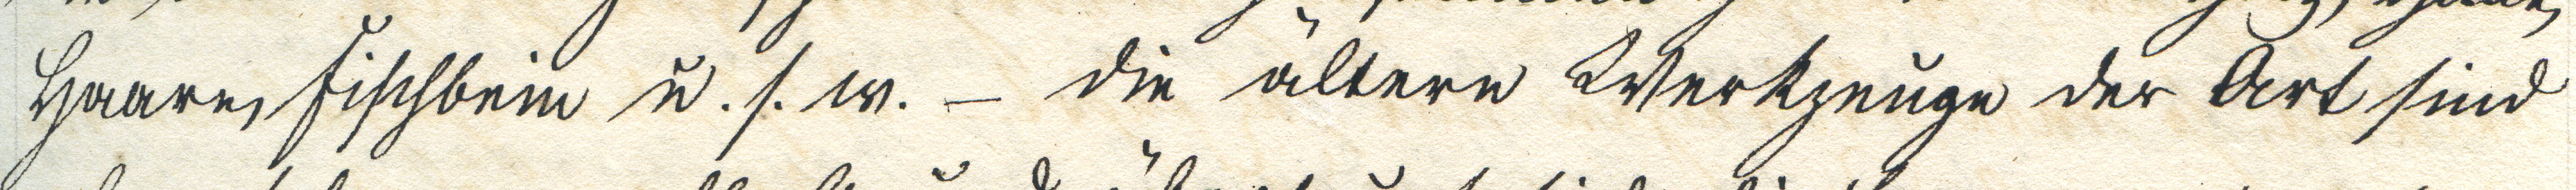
Haare, Fischbein u. s. w. – Die ältern Werkzeuge der Art sind
